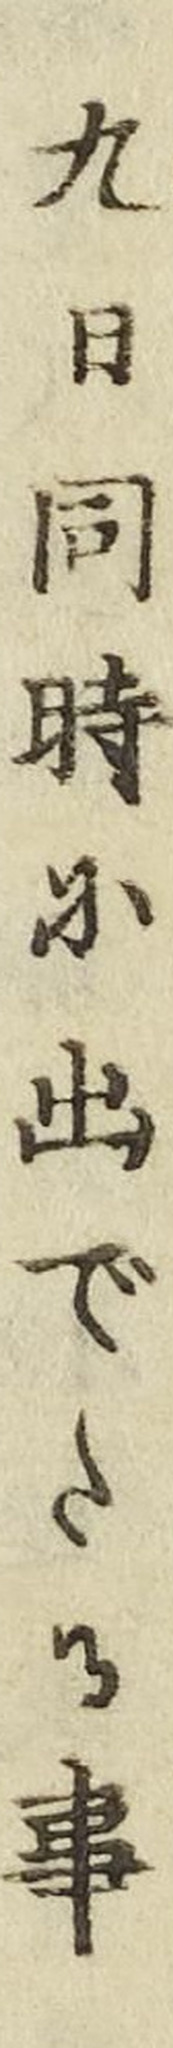九日同時に出でたる事
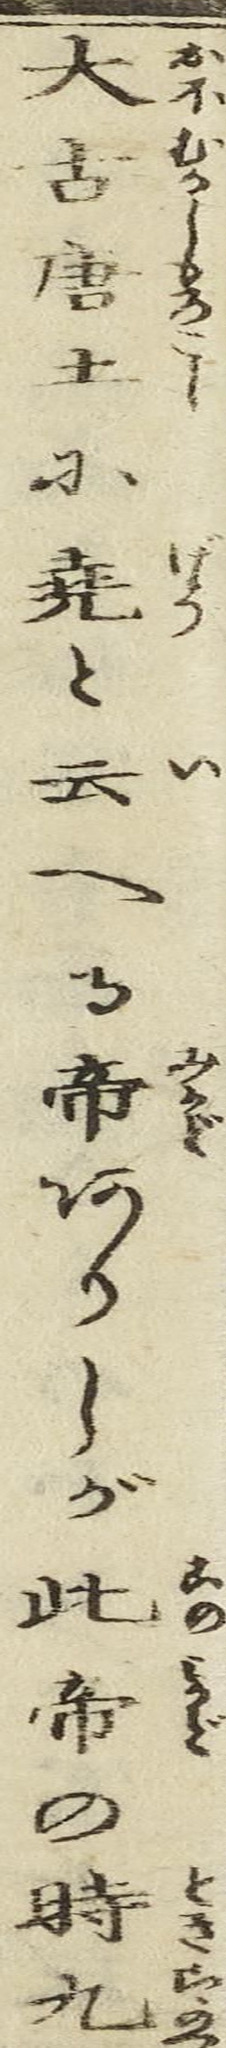大古唐土に堯と云へる帝ありしが此帝の時九
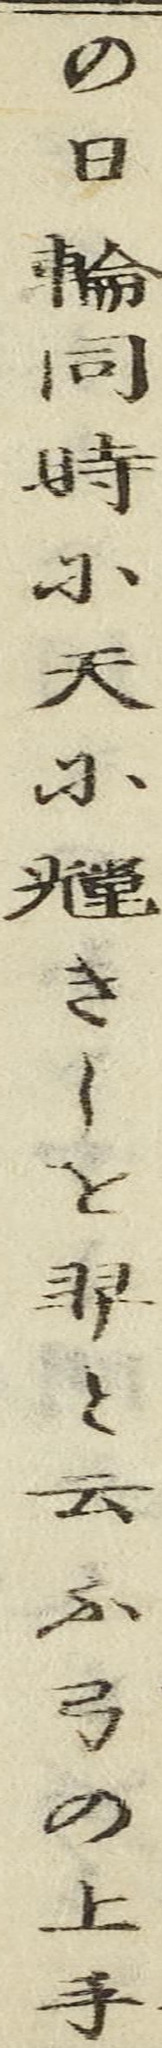の日輪同時に天に輝きしを羿と云ふ弓の上手
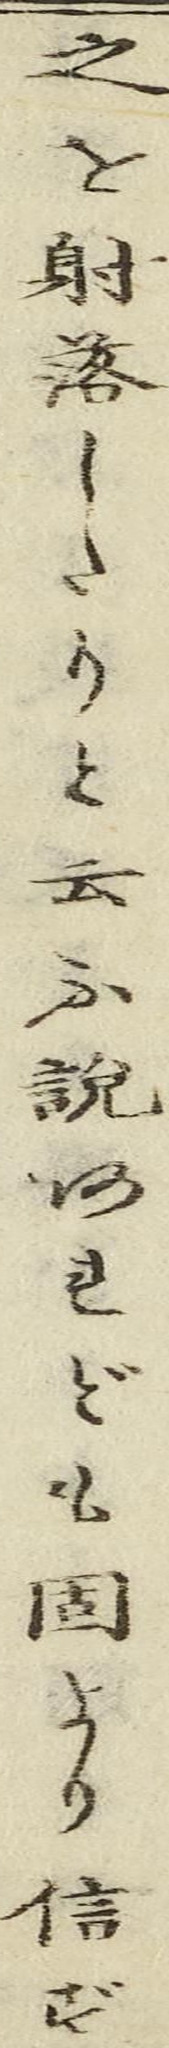之を射落したりと云ふ説あれども固より信ず
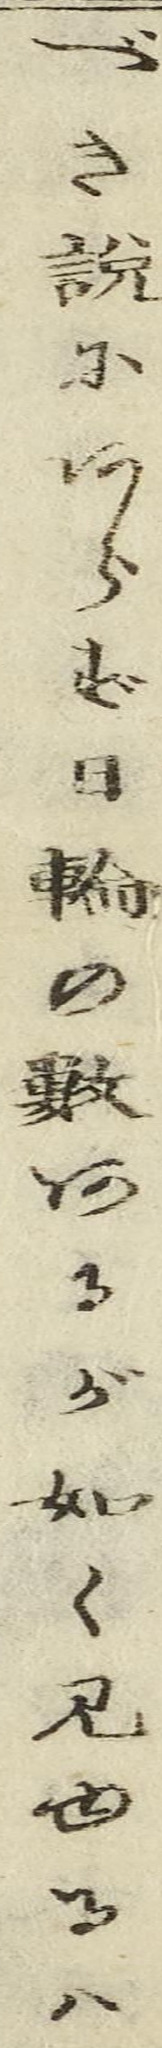べき説にあらず日輪の数あるが如く見ゆるは
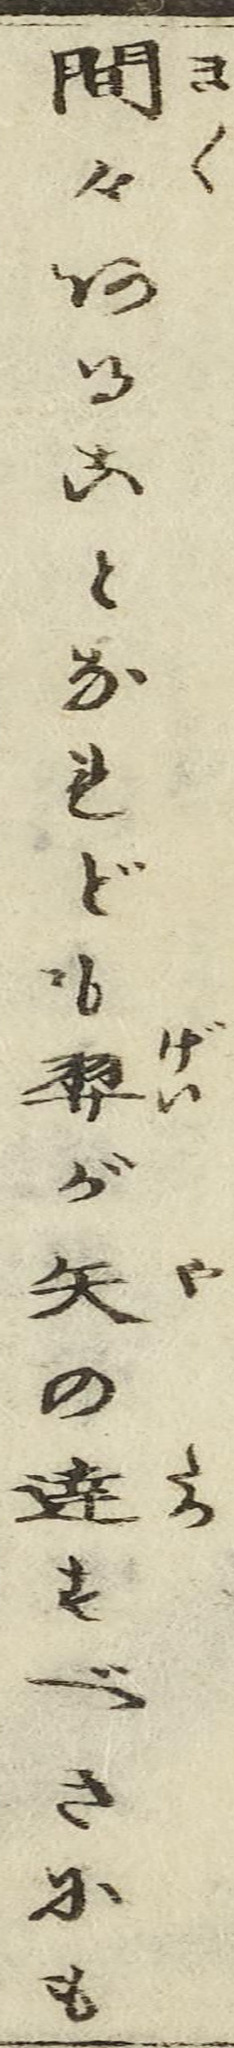間々あることなれども堯が矢の達すべきにも
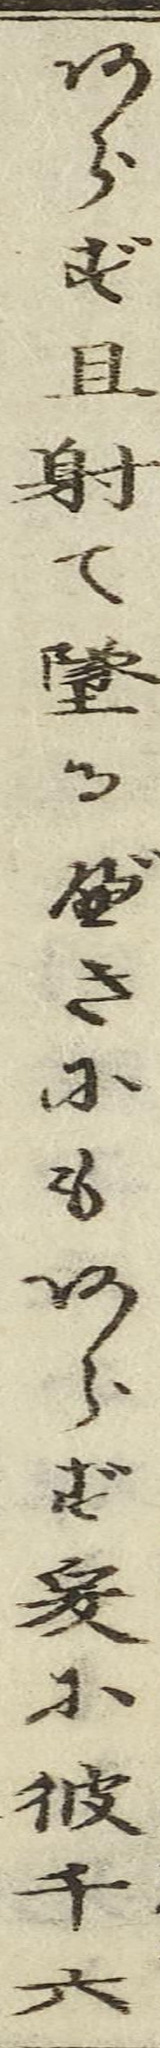あらず且射て墜るべきにもあらず爰に彼千六
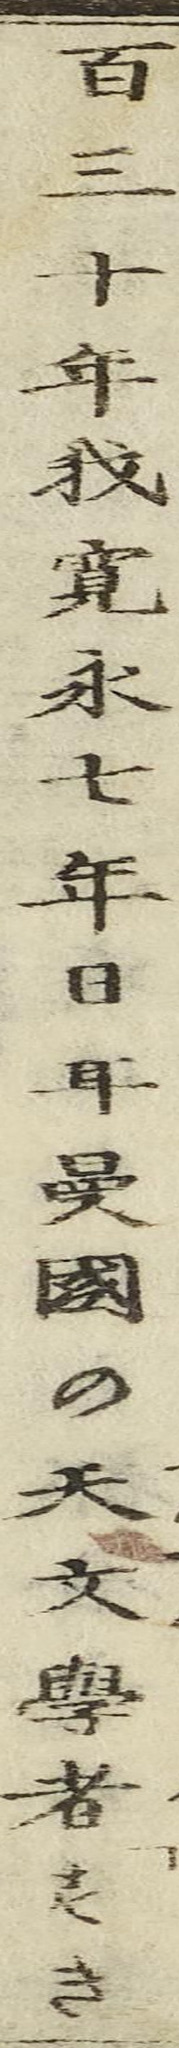百三十年我寛永七年日耳曼国の天文学者「すき
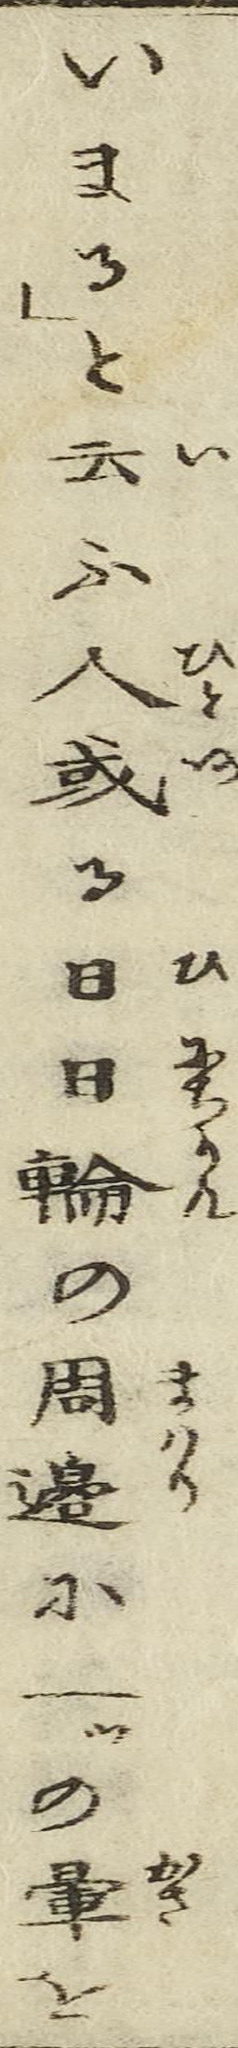いまる」と云ふ人或る日日輪の周辺に一暈を
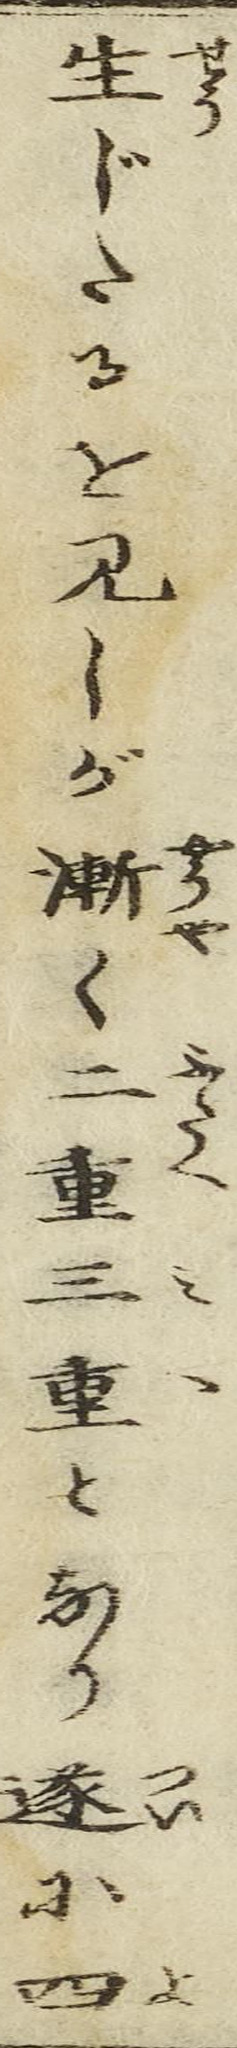生じたるを見しが漸く二重三重となり遂に四

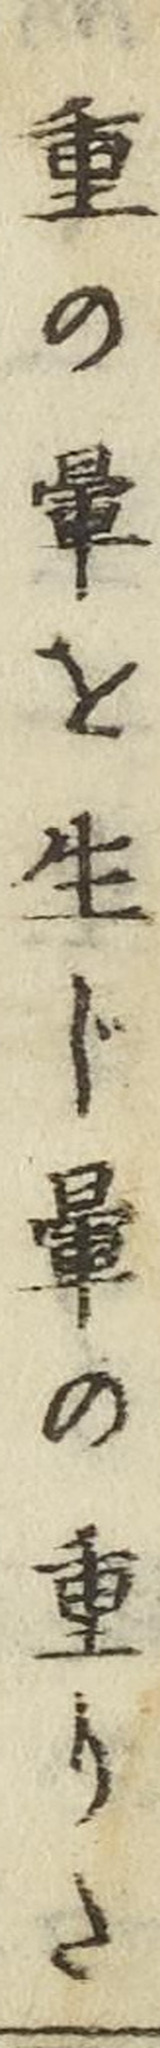重の暈を生じ暈の重りた
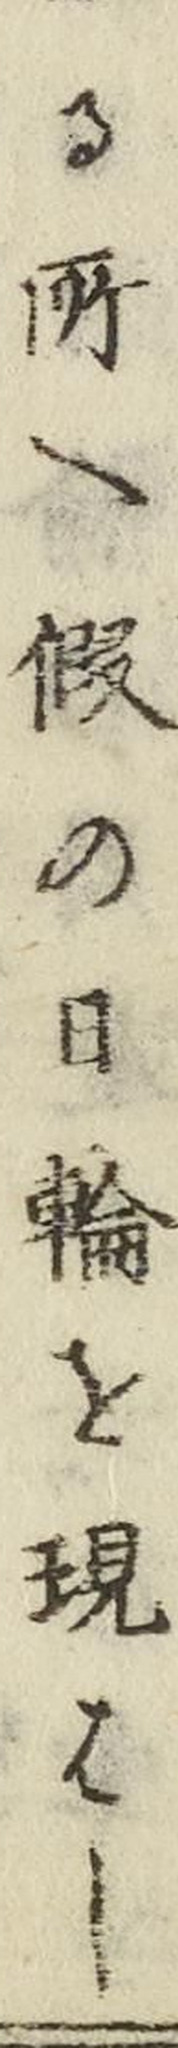る所へ仮の日輪を現はし
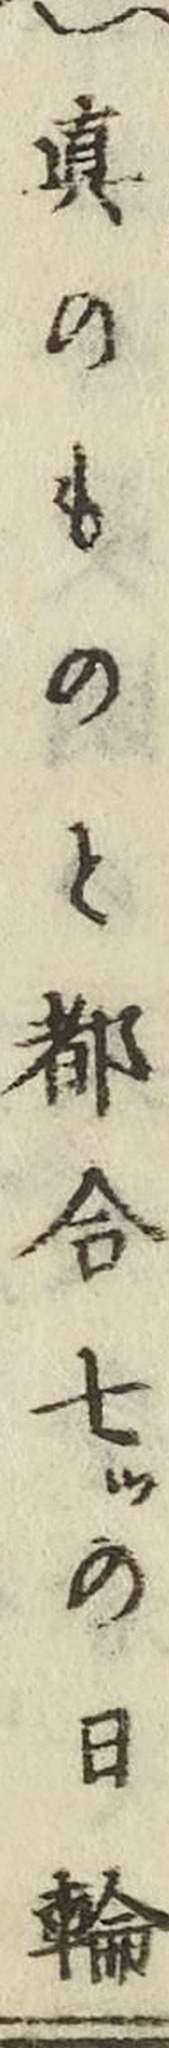真のものと都合七つの日輪
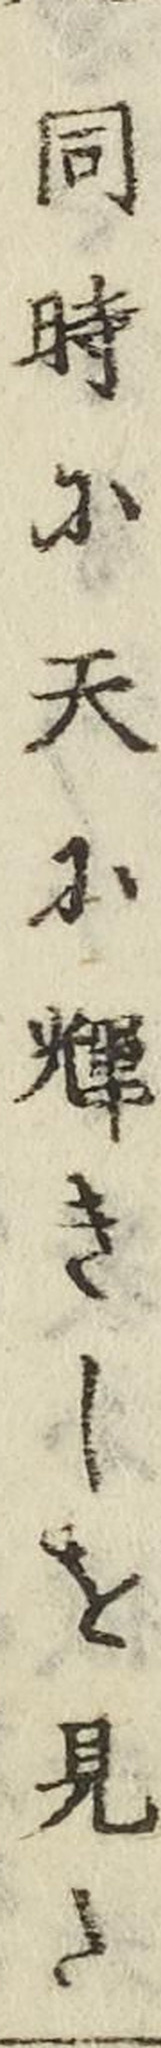同時に天に輝きしを見た
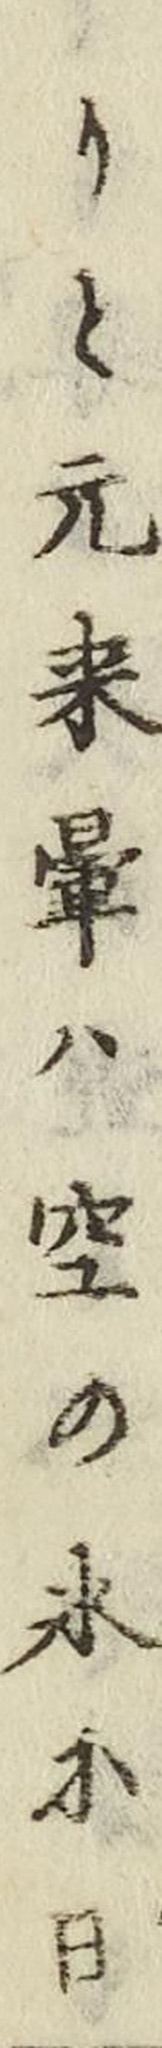りと元来暈は空の氷に日
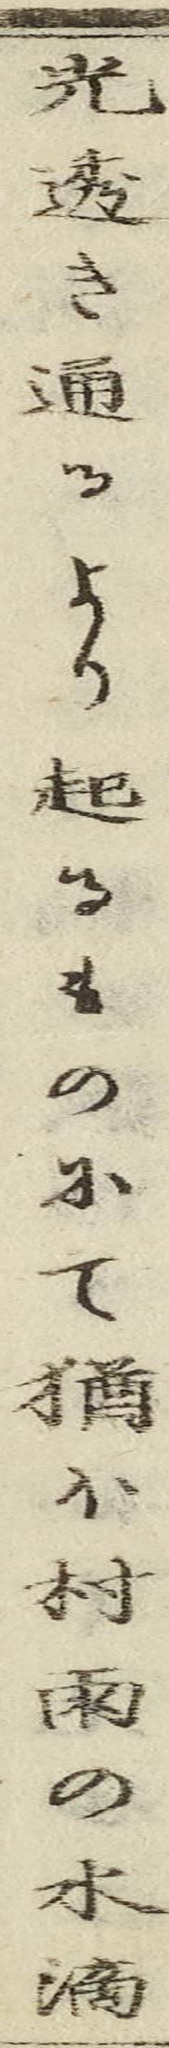光透き通るより起るものにて猶ほ村雨の水滴
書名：天変地異
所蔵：東京大学地震研究所図書室 Earthquake Research Institute Library, The University of Tokyo, JAPAN
